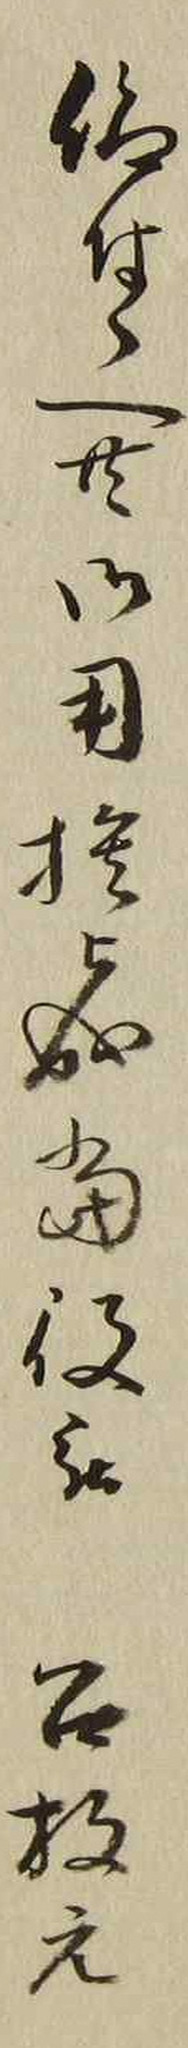仰付候へ共御用捨被成当役被召放元
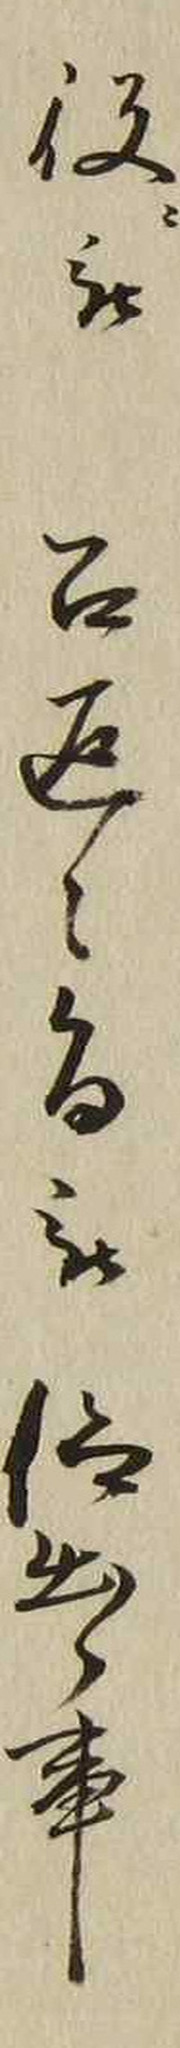役ニ被召返之旨被仰出候事
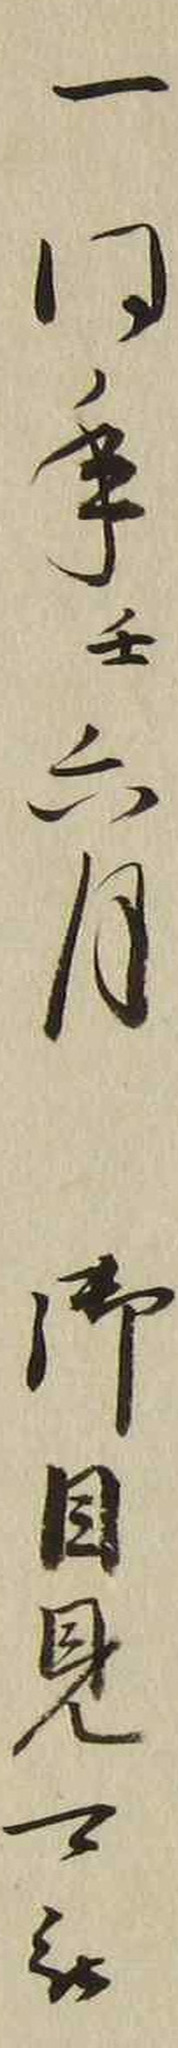一同年閏六月御目見可被
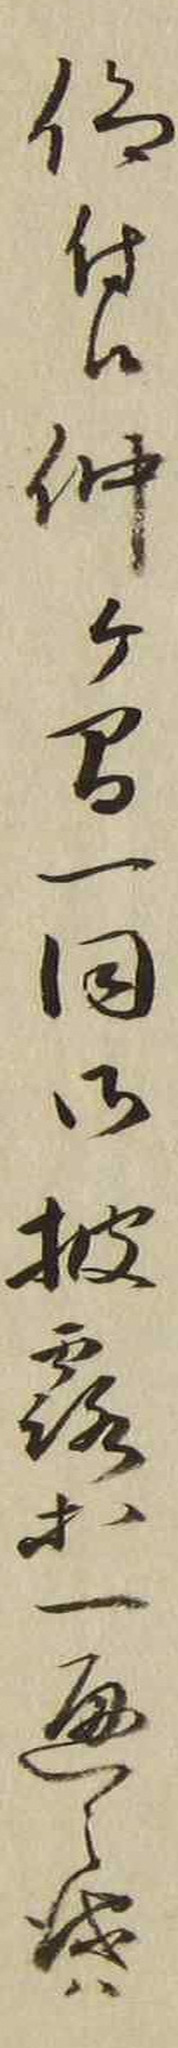仰付候仲ヶ間一同御披露等一通之儀ハ

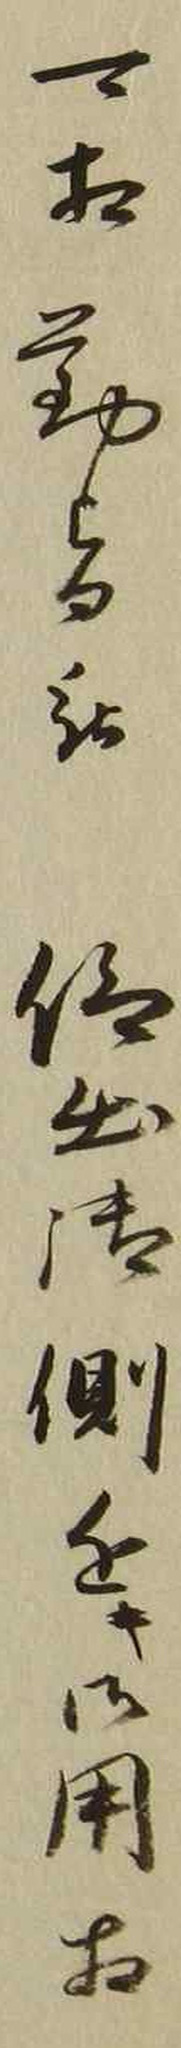可相勤旨被仰出御側近キ御用相
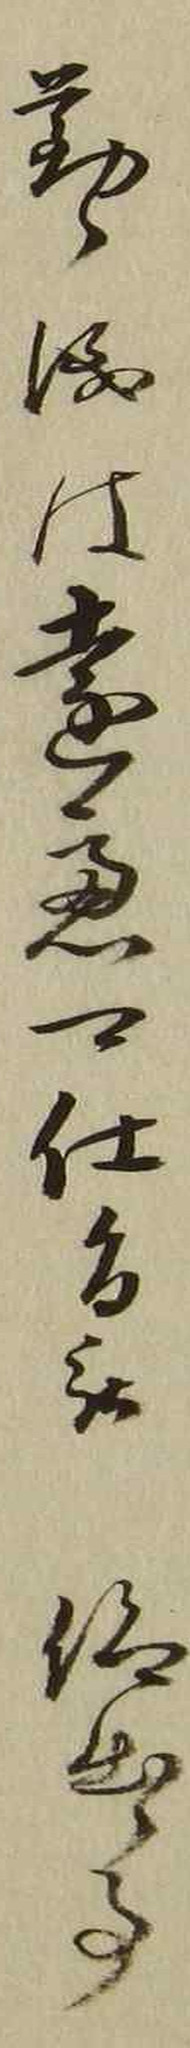勤候儀は遠慮可仕旨被仰出候事
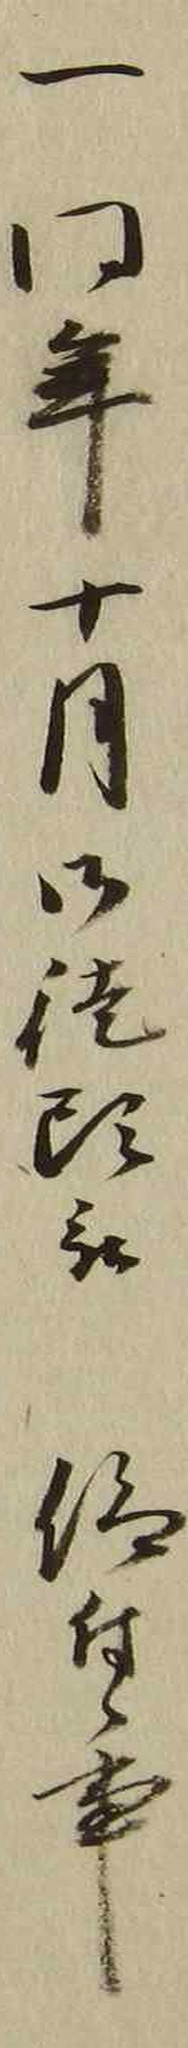一同年十月御徒頭被仰付候事
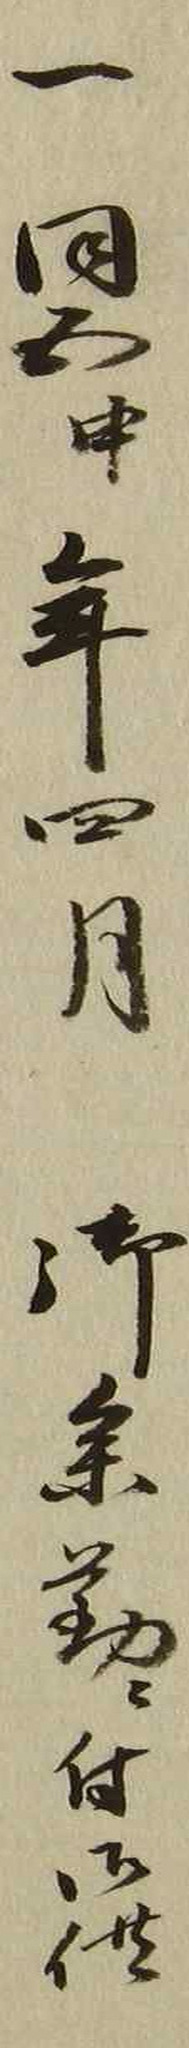一同五申年四月御参勤ニ付御供
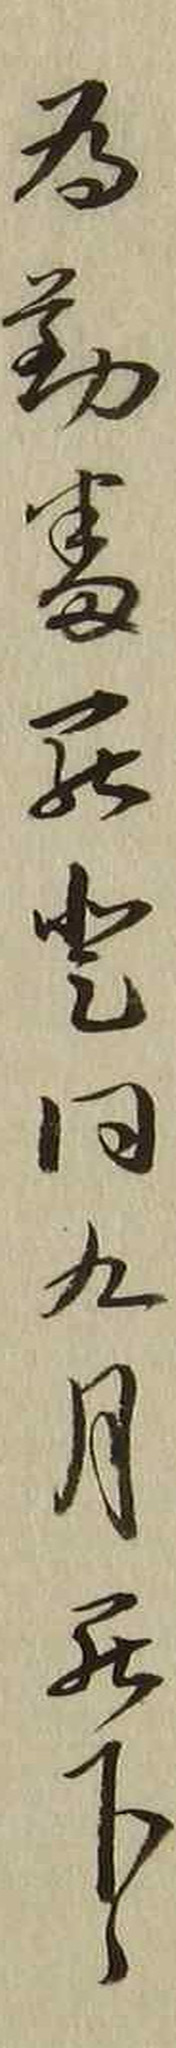為勤番罷登同九月罷下候
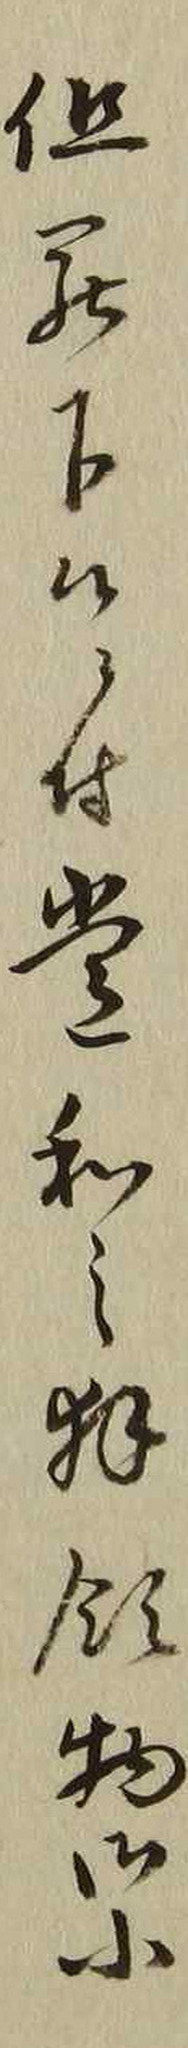但罷下候ニ付常和之拝領物御小
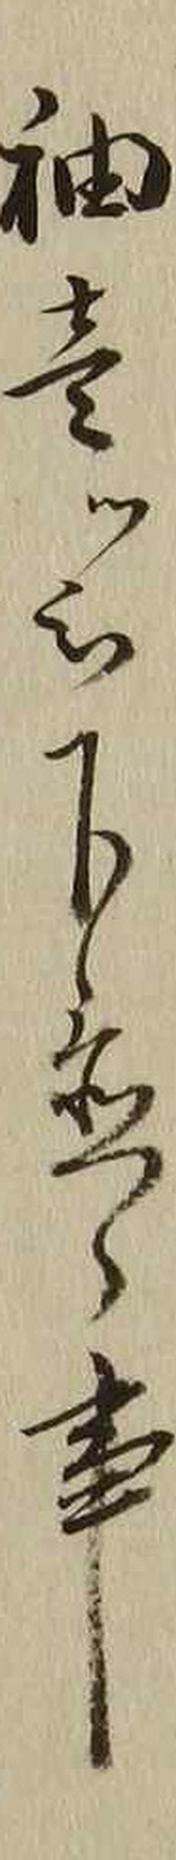袖壱ツ被下置候事
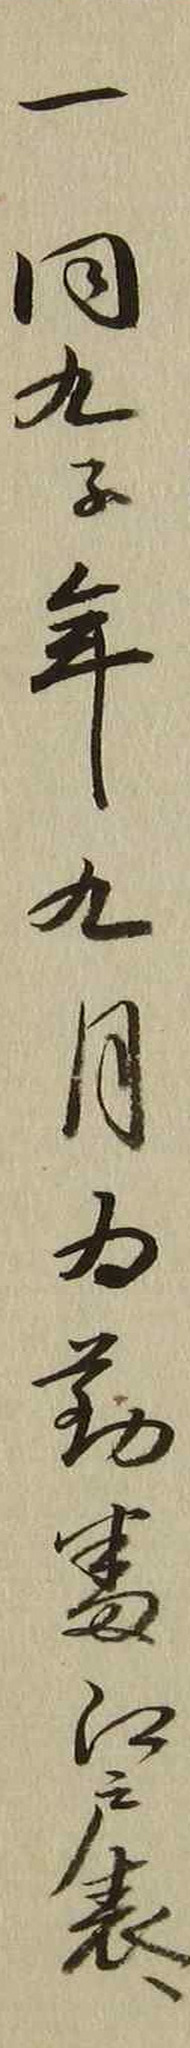一同九子年九月為勤番江戸表へ
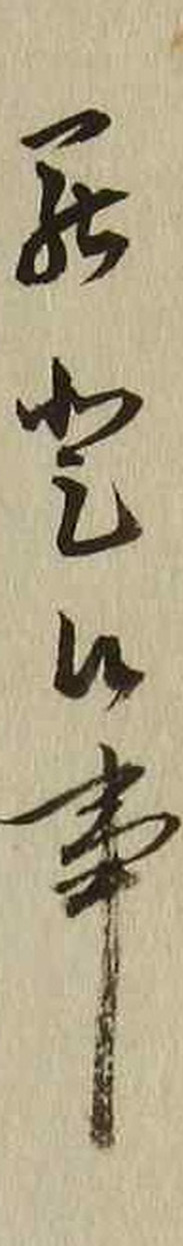罷登候事
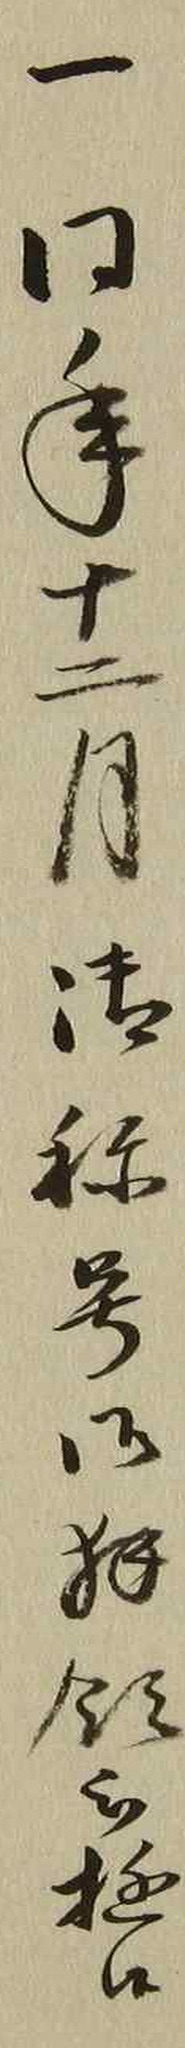一同年十二月御称号御拝領被遊候
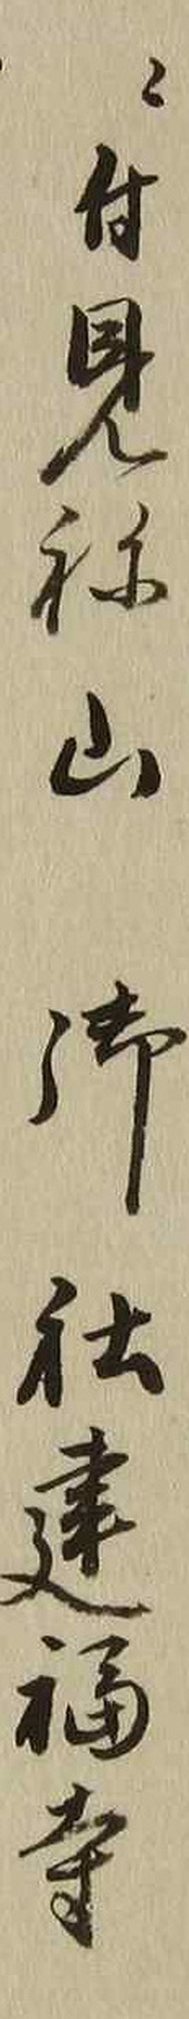ニ付見祢山御社建福寺
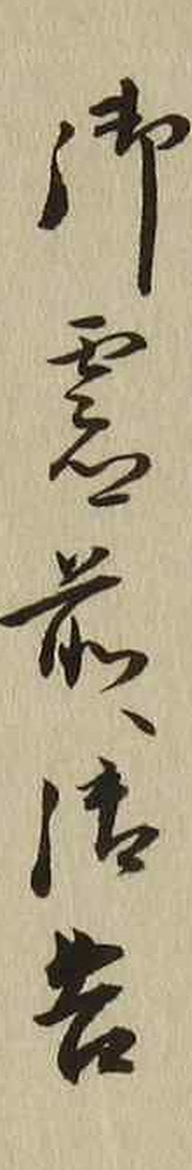御霊前へ御告
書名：諸士系譜　巻之69　を之部3
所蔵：会津若松市立会津図書館
